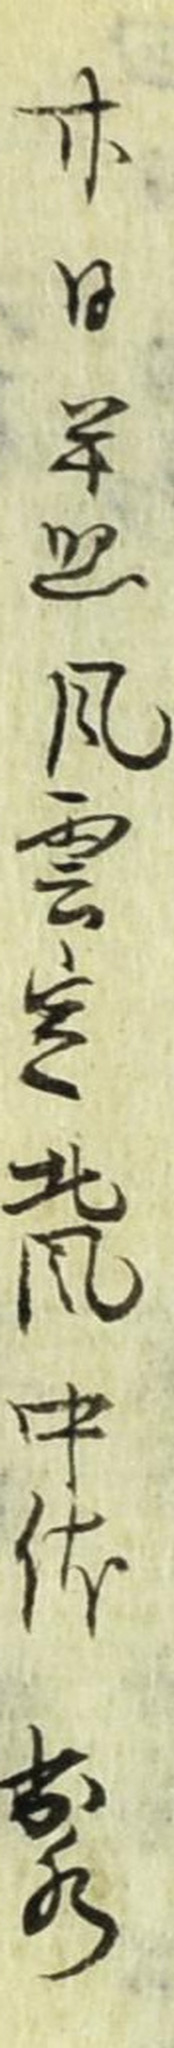廿日半照風雲定北風中伏出水
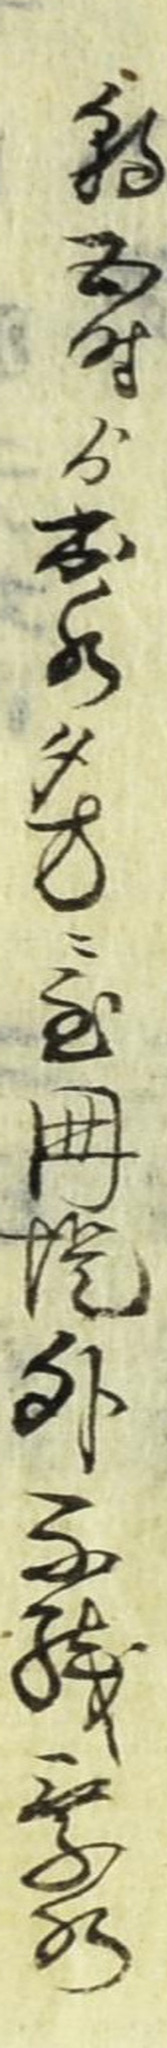朝五時ゟ出水夕方に至冊堤外不残乗水
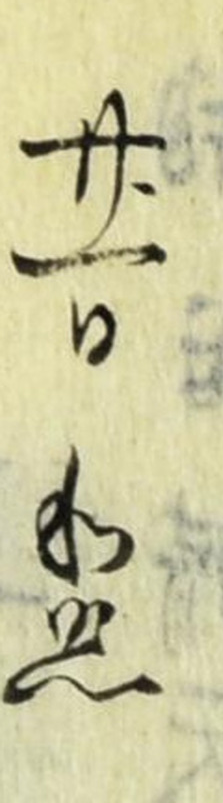廿一日和照
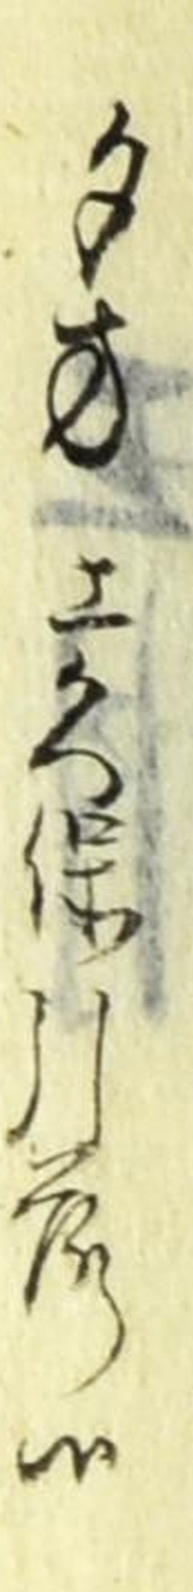夕方上久保引落候
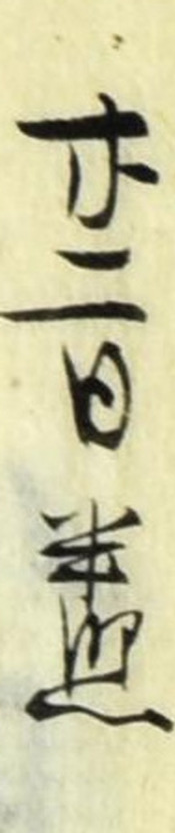十五日半照
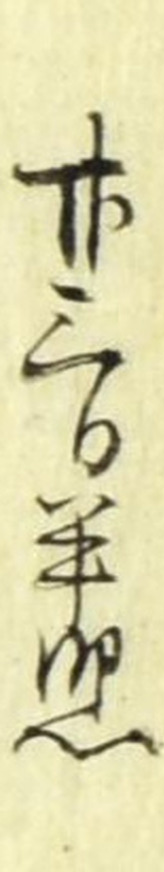十五日半照
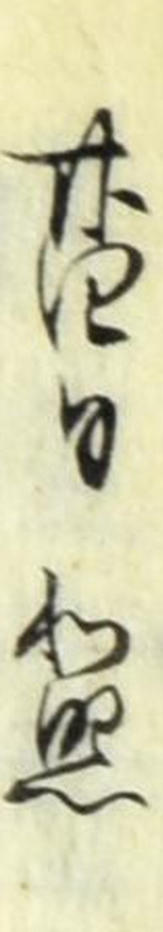廿一日和照

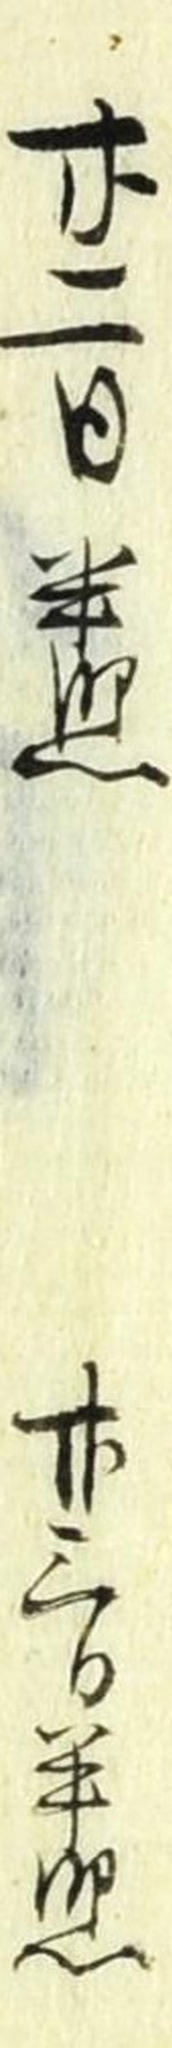廿二日半照廿三日半照
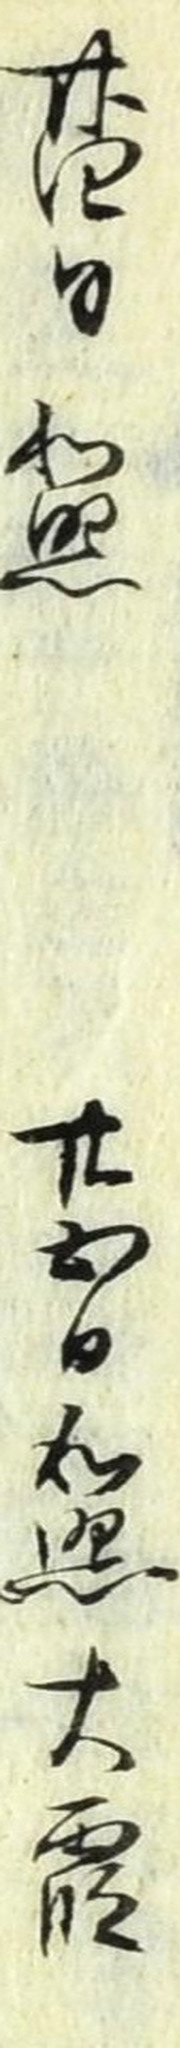廿四日和照廿五日和照大霞
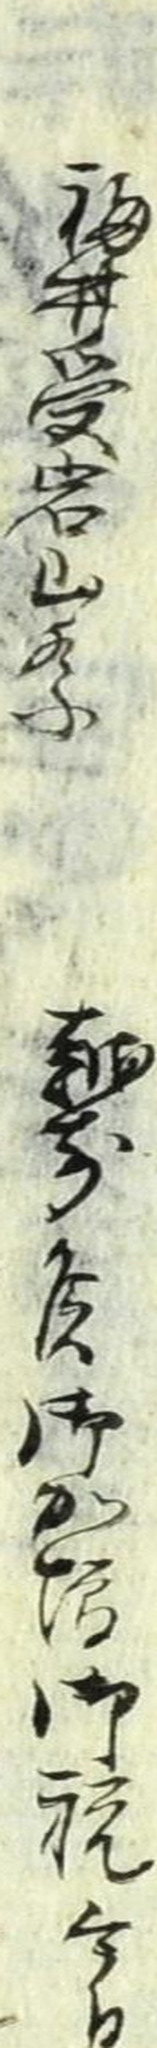福井受岩山祭越前侯御加増御祝今日
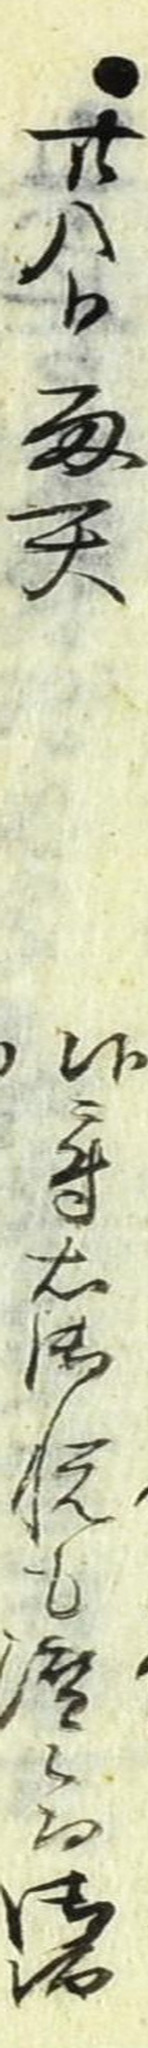廿九日半雨候に付右御祝も潜に而御酒
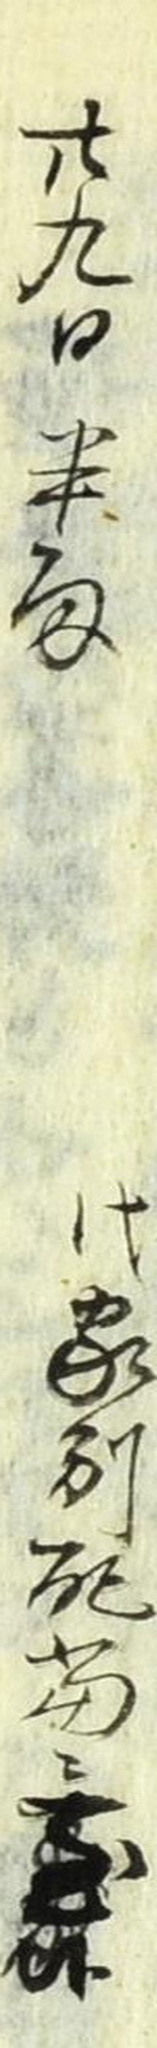三十日半雨末伏代家別配当に至候
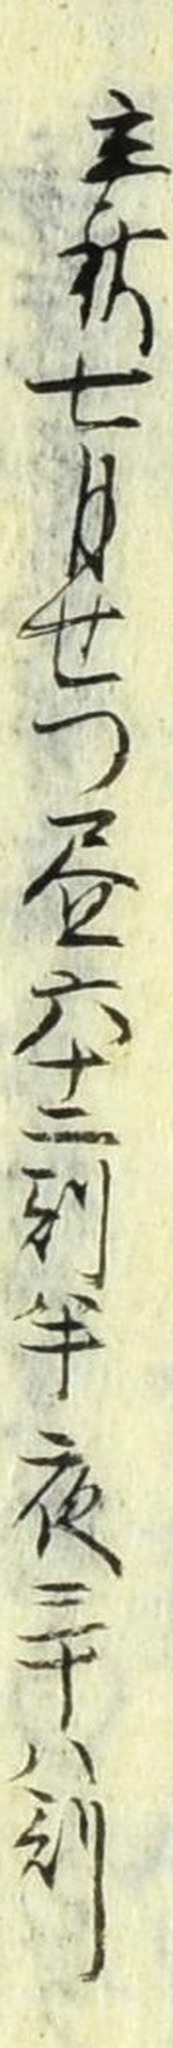主秋七月せつ昼六十二刻半夜三十八刻
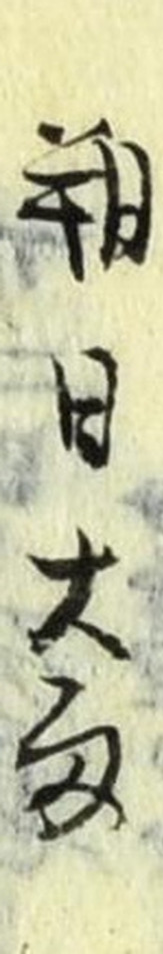六日大雨
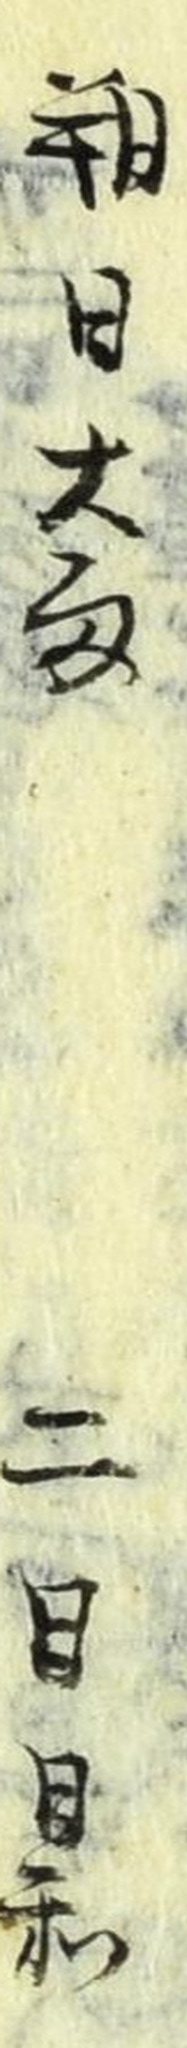朔日大雨二日日和
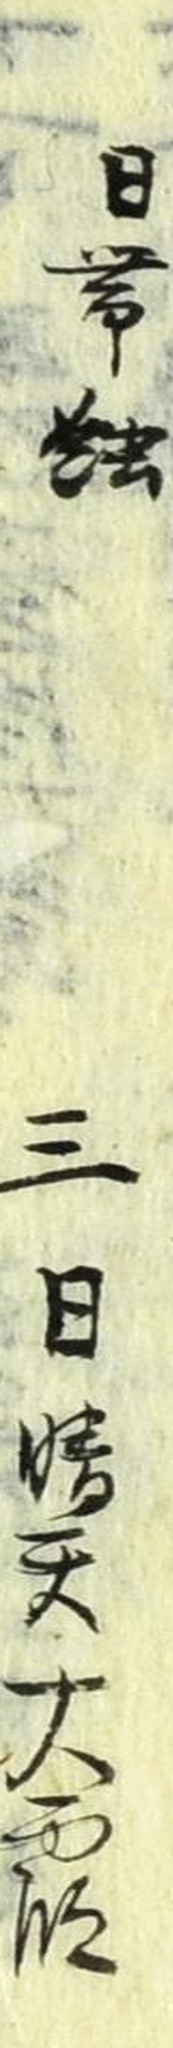日帯蝕三日晴天大霞
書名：（日記）
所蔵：福井県文書館 Fukui Prefectural Archives
